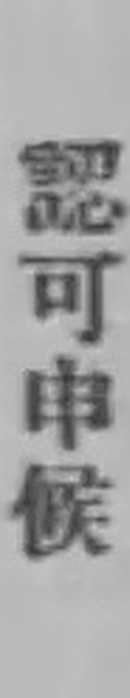認可申候
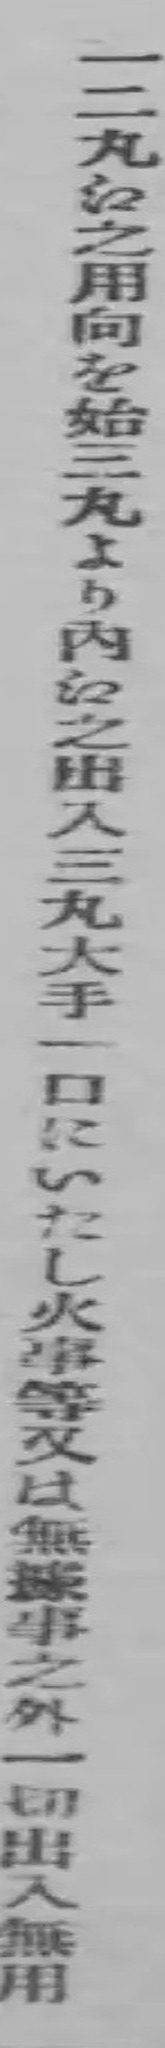一二丸え之用向を始三丸より内え之用入三丸大手一口にいたし火事等又は無拠事之外一切出入無用
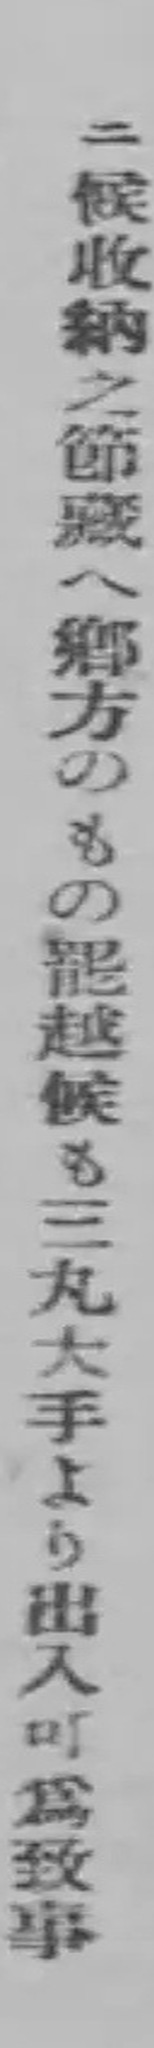ニ候収納之節蔵へ郷方のもの罷越候も三丸大手より出入可為致事
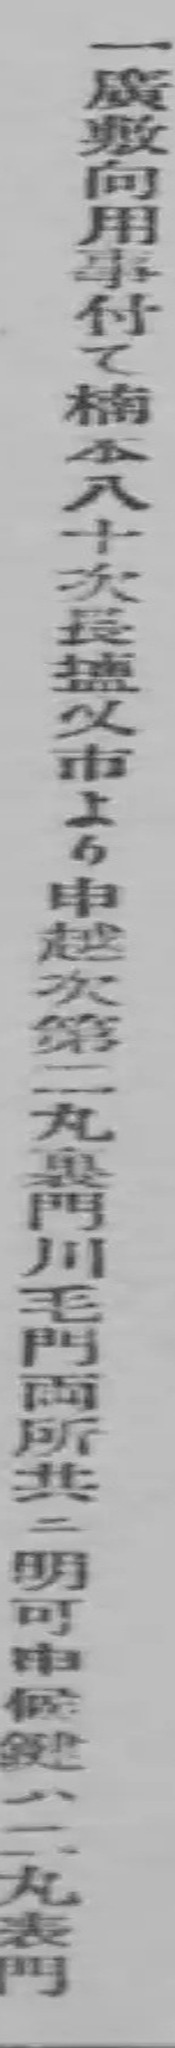一広敷向用事付て楠本八十次長塩又市より申越次第二丸裏門川毛門両所共ニ明可申候鍵は二丸表門
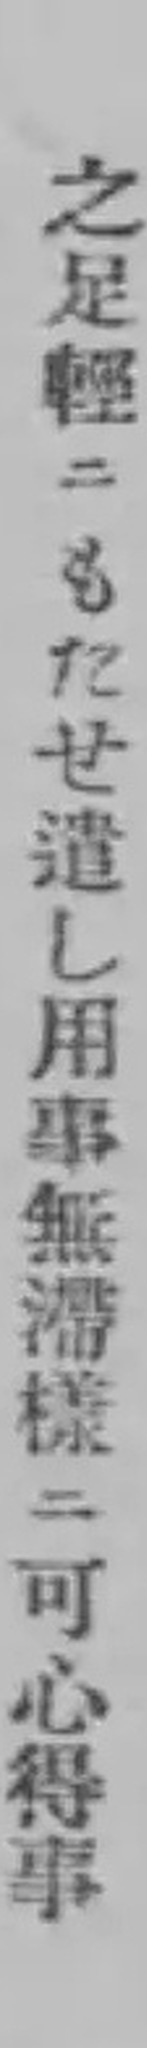之足軽ニもたせ遣し用事無滞様ニ可心得事
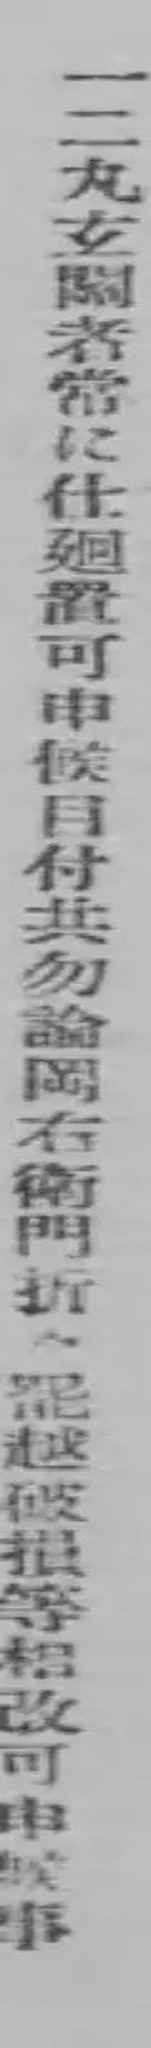一二丸玄関者常に仕廻置可申候目付共勿論岡右衛門折々罷越破損等相改可申候事
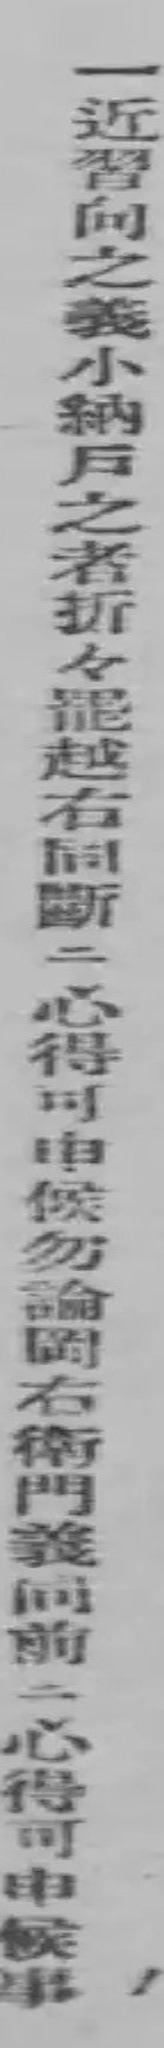一近習向之義小納戸之者折々罷越右同断ニ心得可申候勿論岡右衛門義同前ニ心得可申候事
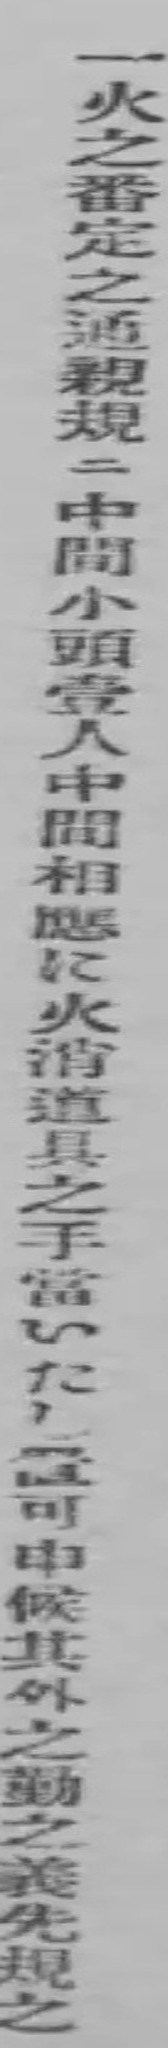一火之番定之通親規ニ中間小頭壱人中間相応に火消道具之手当いたし置可申候其外之勤之義先規之
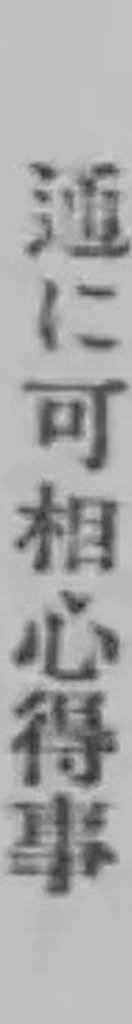通に可相心得事
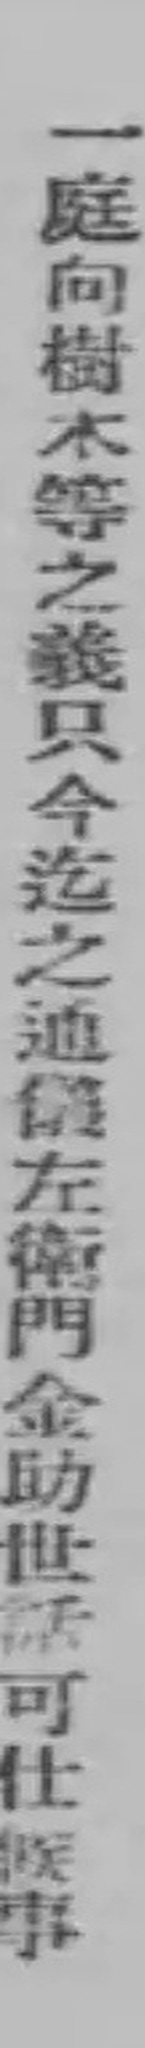一庭向樹木等之義只今迄之通儀左衛門金助世話可仕候事
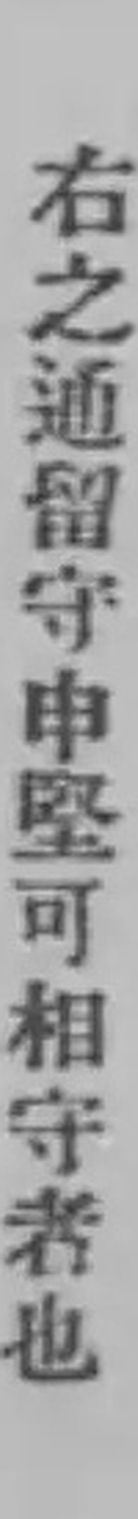右之通留守申堅可相守者也
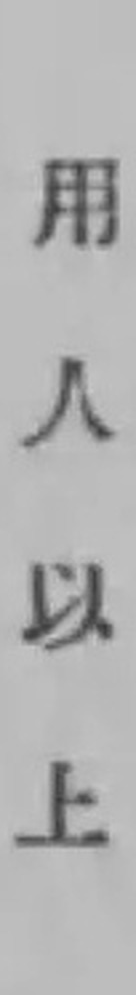用人以上
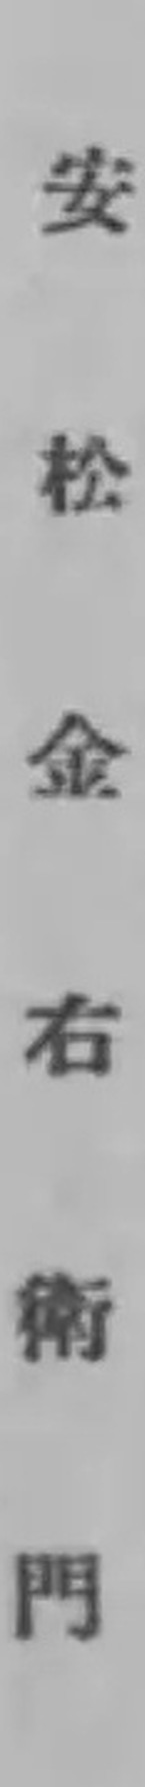安松金右衛門
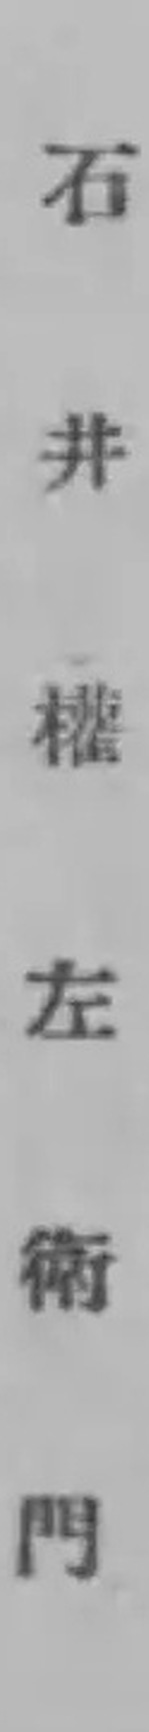石井権左衛門
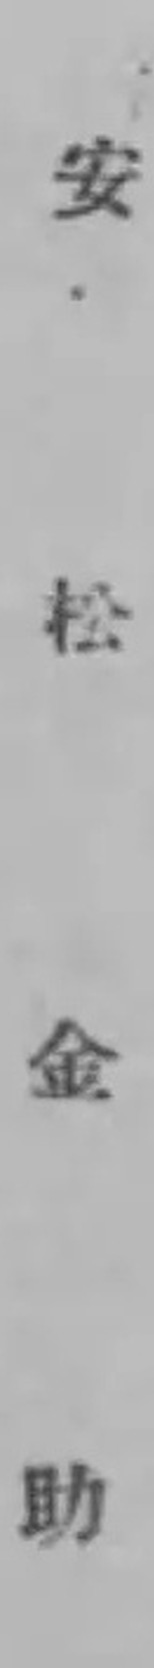安松金助
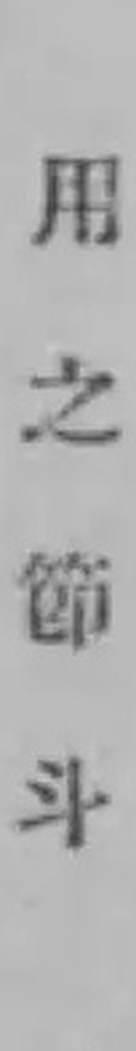用之節斗
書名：豊橋市史談
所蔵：国立国会図書館 National Diet Library, JAPAN
